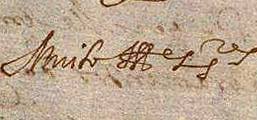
Muito Il̄les Sres
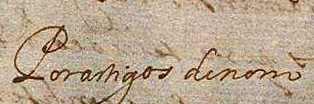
Por artigos de nono
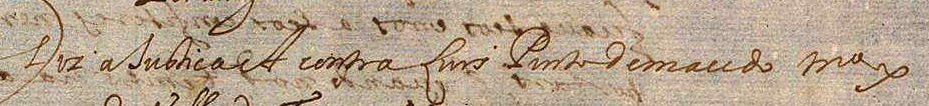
Diz a Iustiça A contra Luis Pinto de macedo mor e
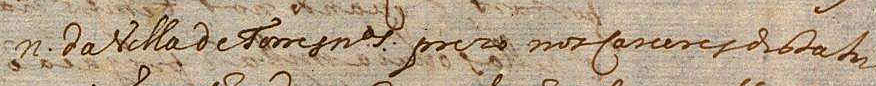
n. da Villa de Torres nas. prezo nos Carceres desta In
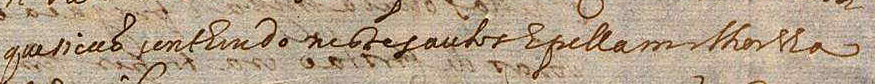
quisiçaõ contheudo nestes autos E pella milhor Via
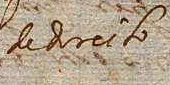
de direito
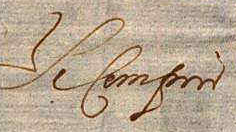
Se Comprir
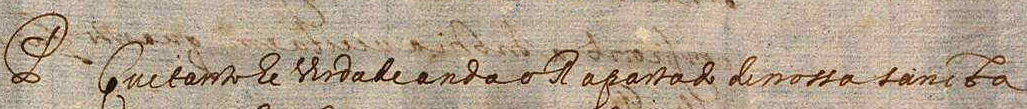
1 P. Que tanto he Verdade anda o R apartado de nossa sancta
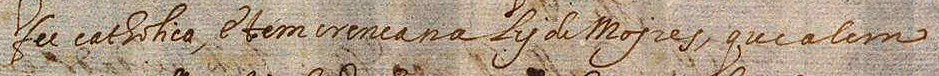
fee catholico, e tem crença na Lej de Mojzes, que alem
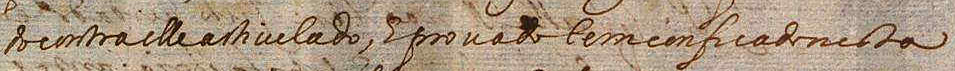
do contra elle articulado, E prouado tem confeçado nesta
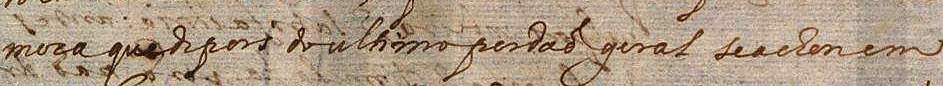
meza que depois do ultimo perdaõ geral se achou em
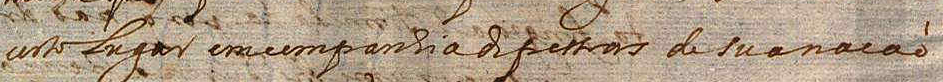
certo Lugar em companhia de pessoas de sua naçaõ
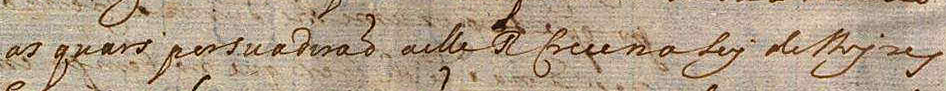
as quais persuadiraõ a elle R Crece na Ley de Moyzes
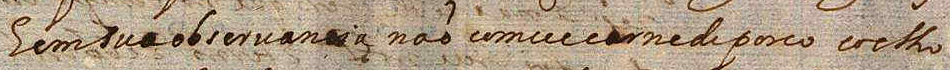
E em sua obseruancia naõ comece carne de porco coelho
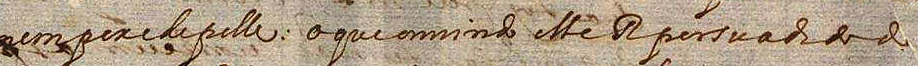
nem pexe de pelle: o que ouuindo elle R persuadido do
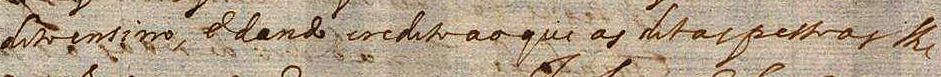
dito ensino, e dando credito ao que as ditas pessoas lhe
